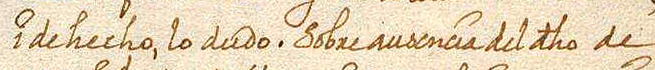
i de hecho, lo dudo. Sobre ausencia del d̄ho de
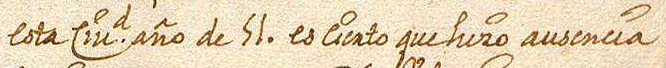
esta Ciu.d año de 51. es cierto que hizo ausencia
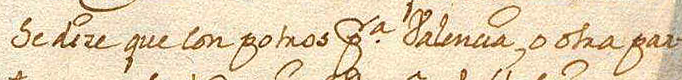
Se dize que con potros p.ra Valencia, o otra par
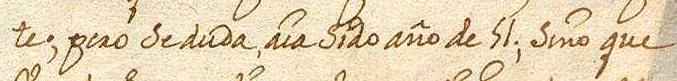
te, pero se duda, aia sido año de 51; Sino que
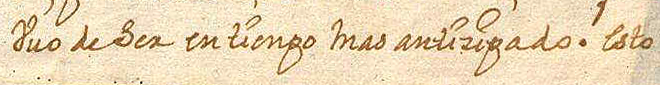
Vuo de Ser en tienpo mas antizipado. Esto
